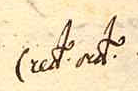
Cred̄.o ord̄.o
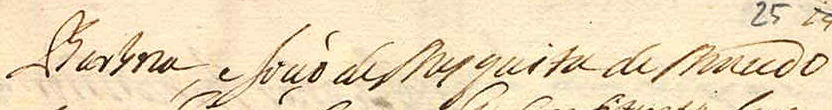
Barboza, e Joaõ de Mesquita de Macedo
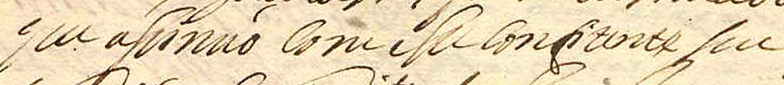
que assinaõ com elle confitente seu
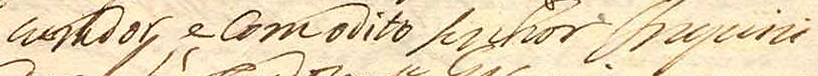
curador e com o dito senhor Jnquizi
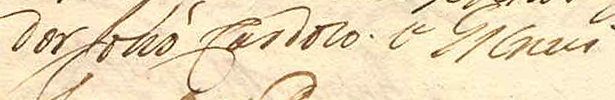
dor Joaõ Cardozo. O Escreui
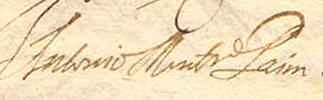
Antonio Montro Paim
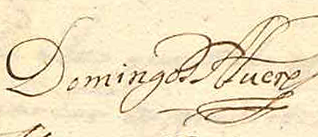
Domingos Alueres
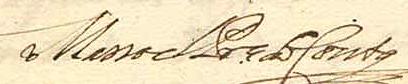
Manoel Pr.a do Couto
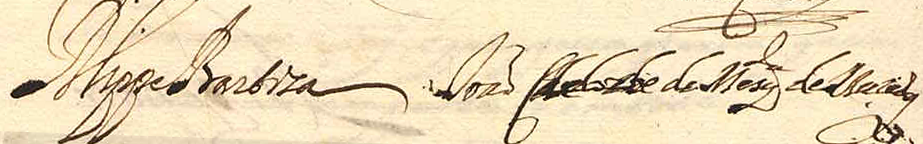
Filippe Barboza Joaõ Cardozde de Mesqta de Macedo
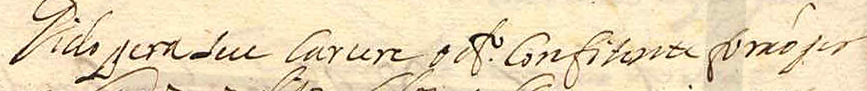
E ido pera seu carcere o d̄.o Confitente foraõ per
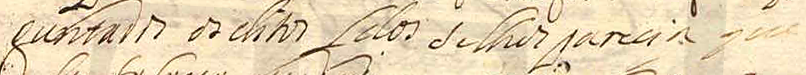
guntados os ditos Ldos se lhos parecia qu
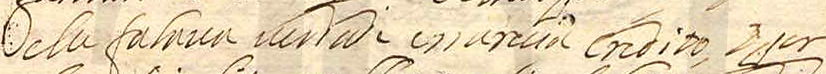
elle falaua uerdade e merecia credito, E por
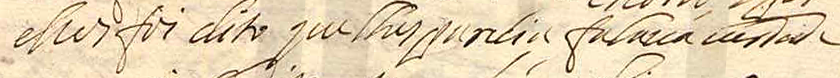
elles foi dito que lhes parecia falaua uerdade
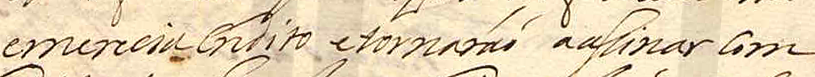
e merecia Credito e tornaraõ a assinar com
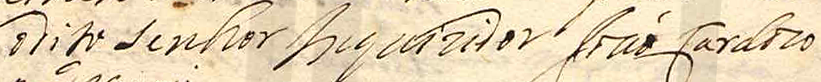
o dito senhor Inquizidor Joaõ Cardozo
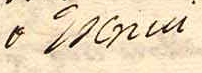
o Escreui
